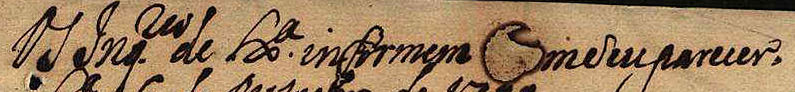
Os Inq.res de Lx.a informem _m seu parecer.
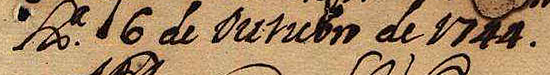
Lx.a 6 de Outubro de 1744.
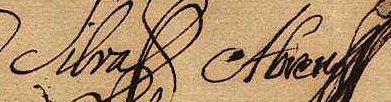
Manoel Silva Abreu
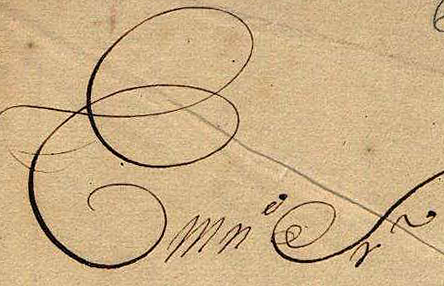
Emn.e Sr.o
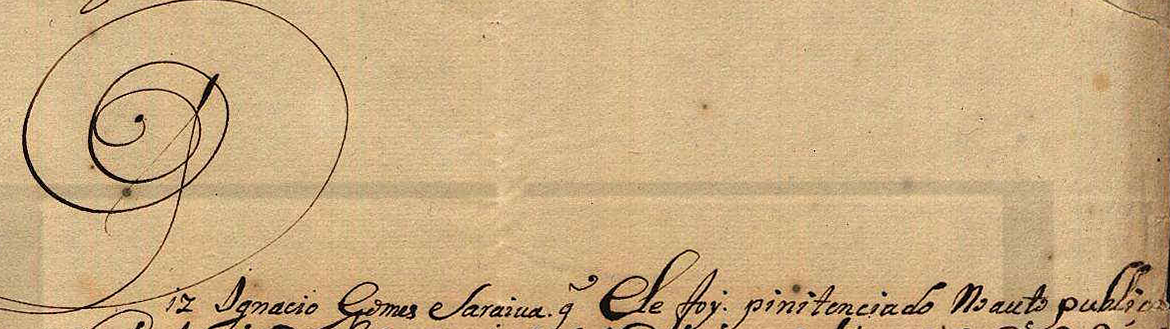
Diz Ignacio Gomes Saraiua q̄ Ele foy. pinitenciado No auto publico
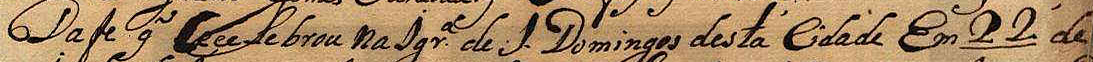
Da fe q̄ Ce celebrou na Igr.a de S. Domingos desta Cidade Em 22 de
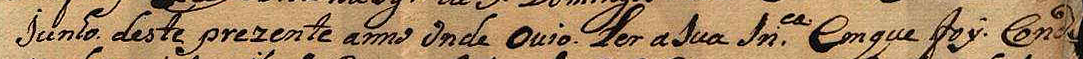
Iunho deste prezente anno onde ouio. Ler a sua Sn.ca Em que foy. Conde
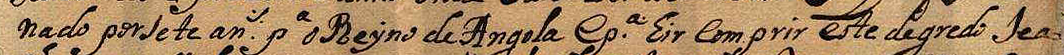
nado por sete an.s pa o Reyno de Angola E p.a hir comprir este degredo se a
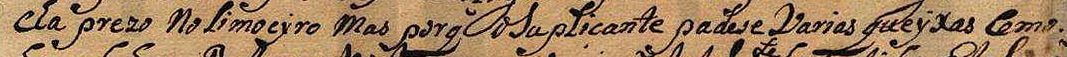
cha prezo no Limoeyro mas porq̄ o suplicante padese Varias queyxas Como.
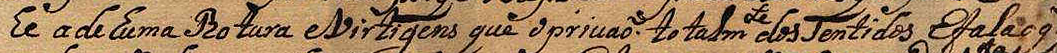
he a de huma Rotura e Virtigens que o priuaõ totalm.te dos sentidos E falao q̄
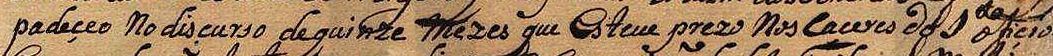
padeceo no discurso de quinze mezes que esteue prezo nos Caceres do Sto oficio
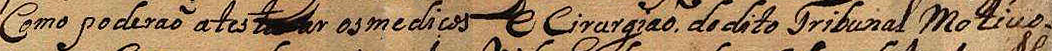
Como poderaõ atest_ar os medicos E Cirurgiaõ do dito Tribunal Motiuo
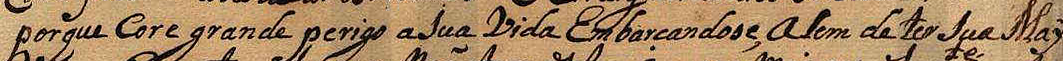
porque Core grande perigo a sua Vida Embarcandose, alem de ter Sua May
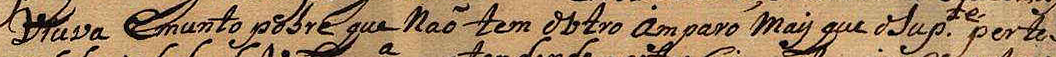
Viuva e munto pobre que naõ tem ovtro amparo mais que o sup.te perte
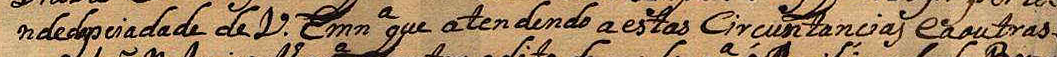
nde da peiadade de V. Emna que atendendo a estas circuntancias e a outras
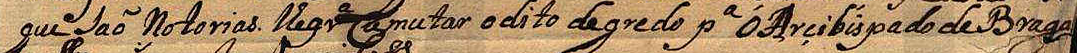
que saõ notorias. lhe qra Comutar o dito degredo p.a o Arcibispado de Braga
